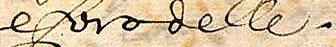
e fora delle.
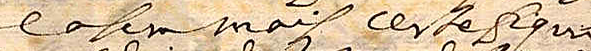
e asim mais certefiquo
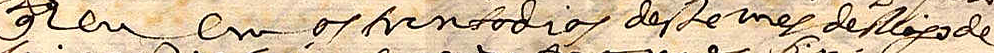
q̄ eu em os trinta dias deste mes de Majo de
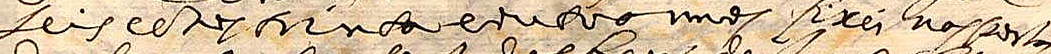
seiscetos trinta e outo annos fixei nas portas
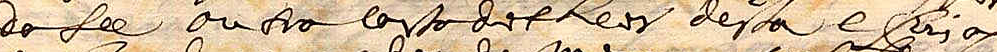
da see outra carta do theor desta e fui as
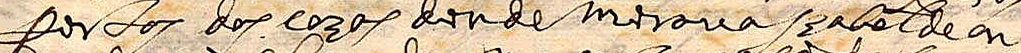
portas das cazas donde moraua jzabel de an
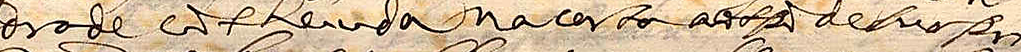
drade cōtheuda na carta ao tpō de sua pri
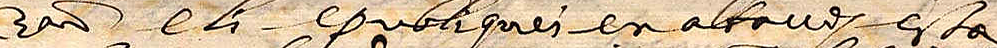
zaõ e li e publiquei en alta uos esta
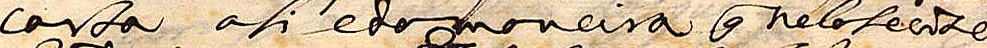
carta asi e da maneira q̄ nela se cōtē
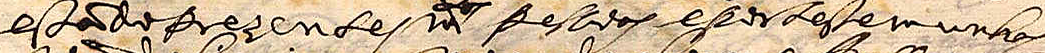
estādo prezentes mtas pessoas e por testemunhas
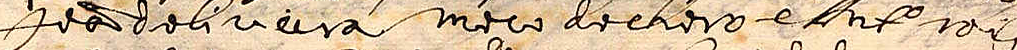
João doliueira moco do choro e Anto roiz̄
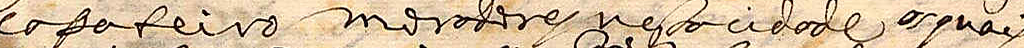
capateiro moradores nesta cidade os quais
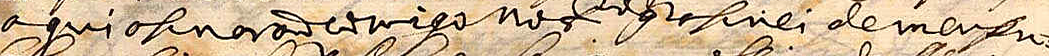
aqui asinarão comigo notro q̄ asinei de meu pu
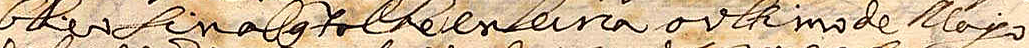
blico sinal q̄ tal he en leiria o vltimo de Mayo
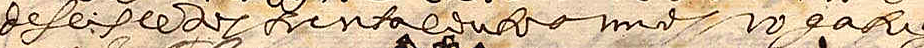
de seiscētos trinta e outo annos rogato
